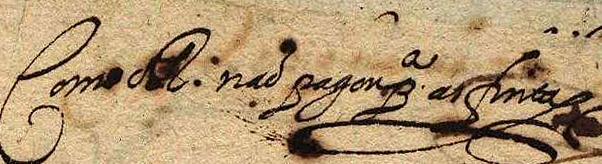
Como o R. naõ pagou ꝑ.a as fintas
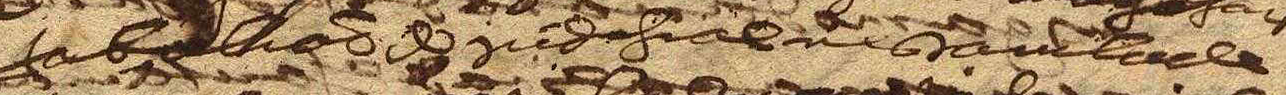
tabaliaõ do judisial nesta uila de
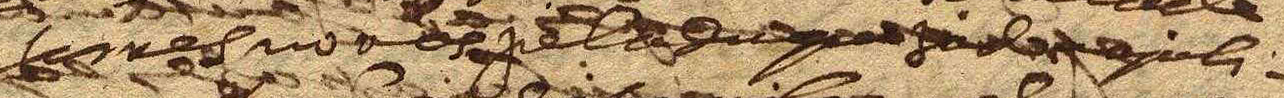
torres nouas pela duqueza dona juli
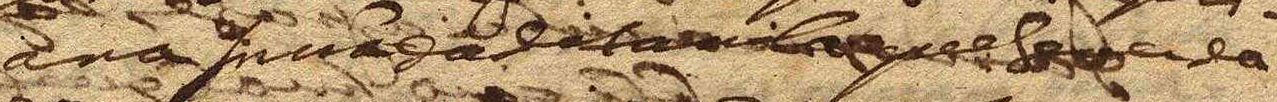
ana Snorā da dita uila que he uerda
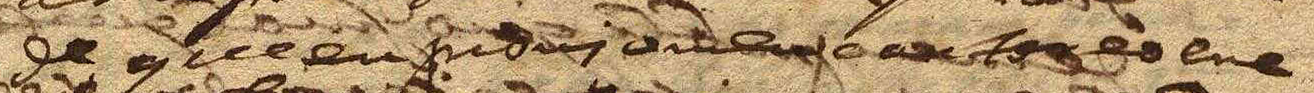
de que eu proui o meu cartoreo e ne
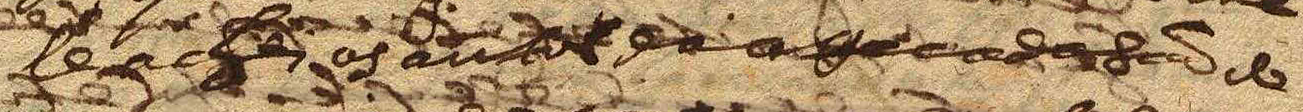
le achei os autos da aRecadasaõ do
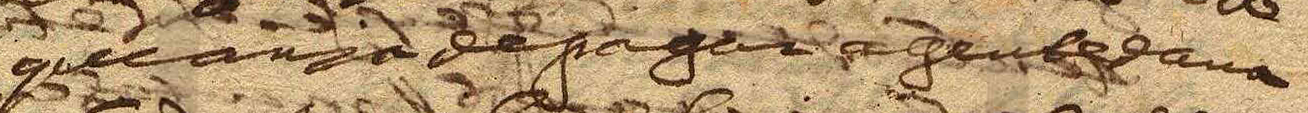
que auja de pagar a gente da na
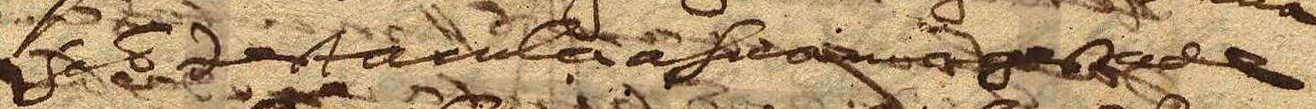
saõ desta uila a sua magestade
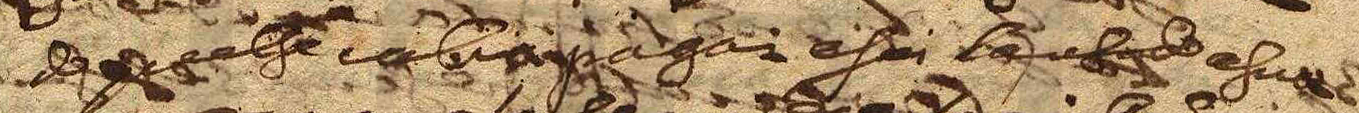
do que lhe cabia pagar e foi lansado a sua
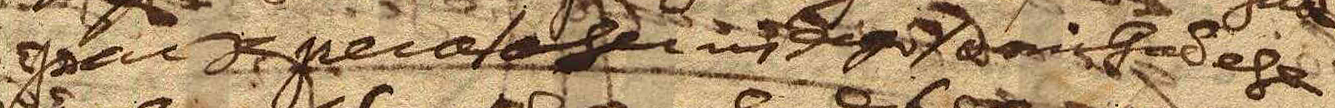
parte pera / o serui digo / o milhaõ e se
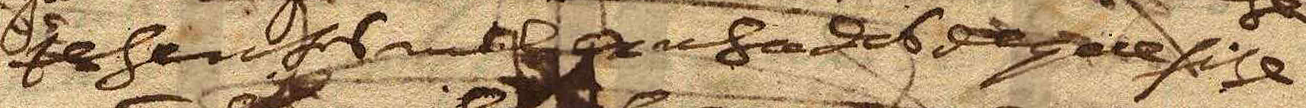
tesentos mil crusados de que fzse
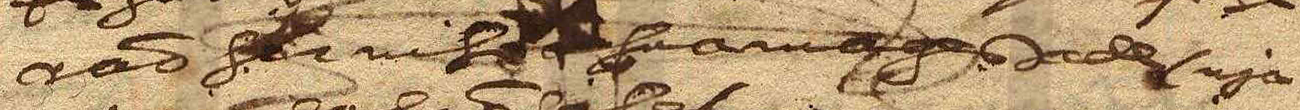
raõ seruiso a sua magestade cuja
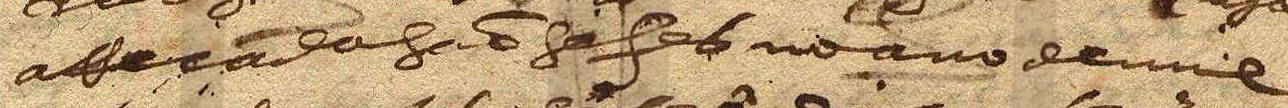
aRecadasaõ se fes no ano de mil
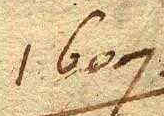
1607
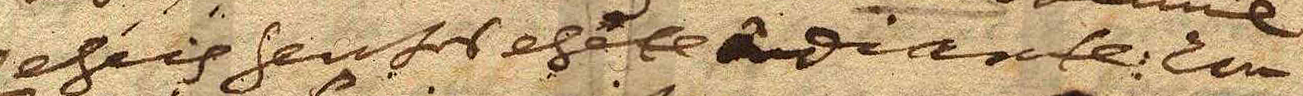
e seissentos e sete ē diante: E ou
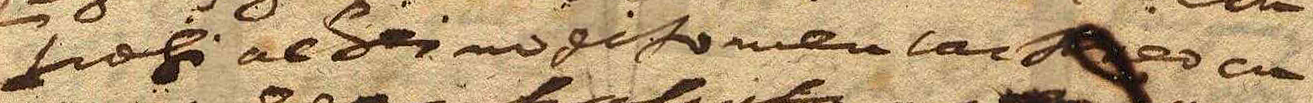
trosi achei no dito meu cartoreo ou
